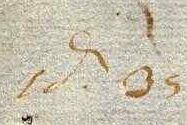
id.e 35
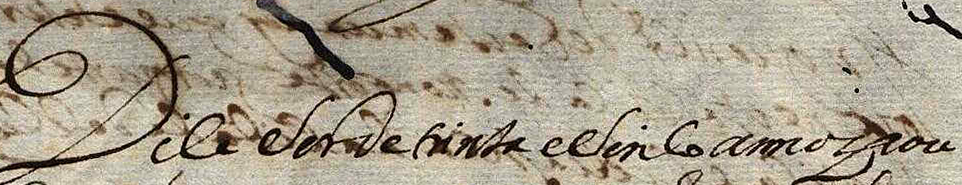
DiCe ser de trinta e sinco annos pou
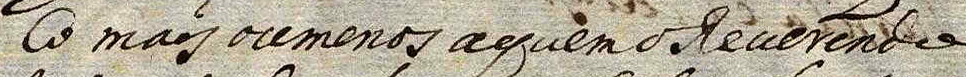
co mais ou menos a quem o Reuerendo
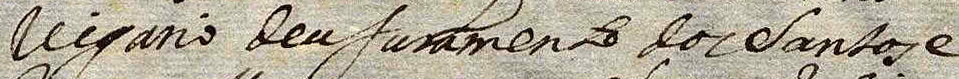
vigario deu Juramento dos Santos e
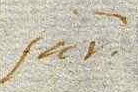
jur.
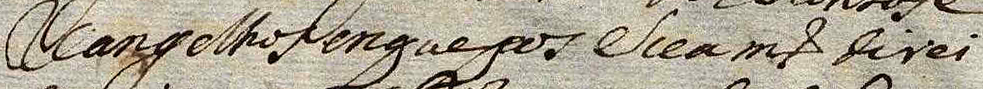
Vangelhos en que pos sua maõ direi
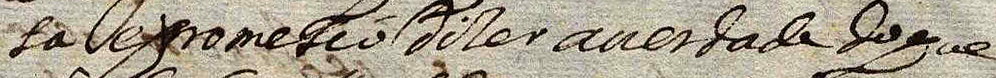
ta e prometeo dizer a uerdade do que
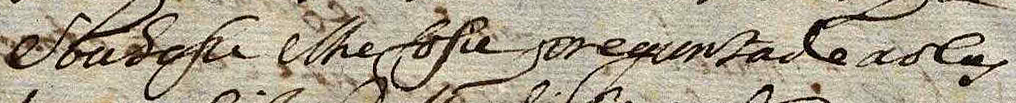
Soubesse e lhe fosse preguntado ao Cus
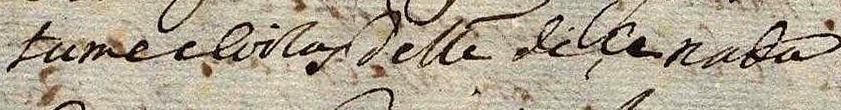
tume e coizas delle dice nada
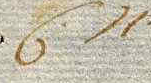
C. n.
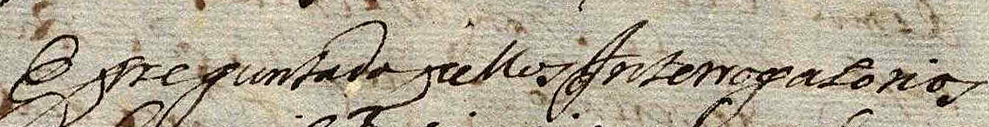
E preguntada pellos Jnterrogatorios
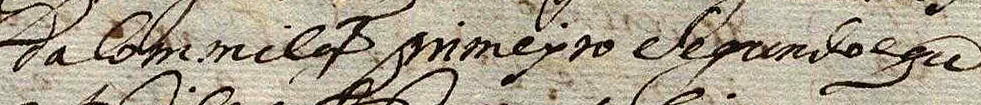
da Commiçaõ primeyro Segundo e qu
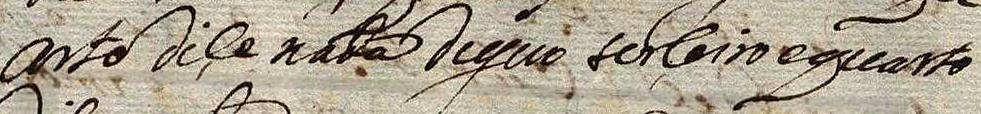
arto dice nada diguo terceiro e quarto
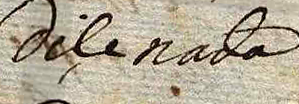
dice nada
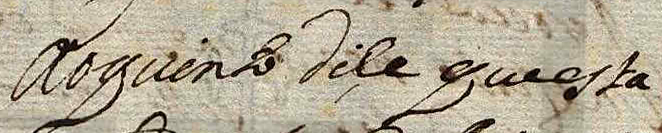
Ao quinto dice que esta
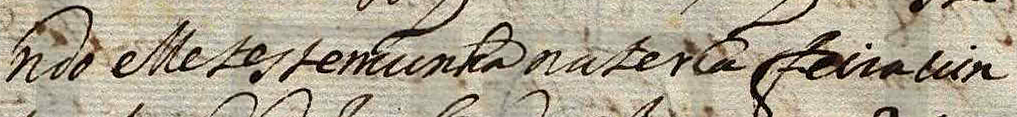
ndo elle testemunha na terça feira uin
